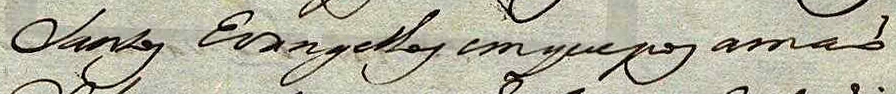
Santos Evangelhos em que pos a maõ
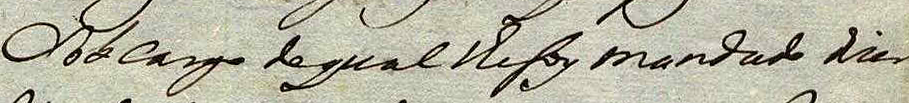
Sob cargo de qual lhe foy mandado dizer
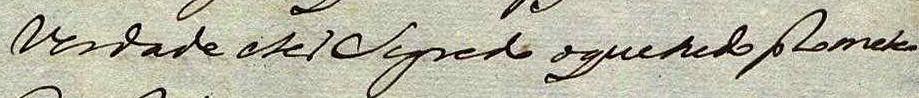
verdade e ter Segredo o que tudo pRometeo
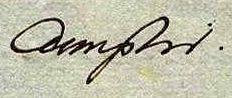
Cumprir.
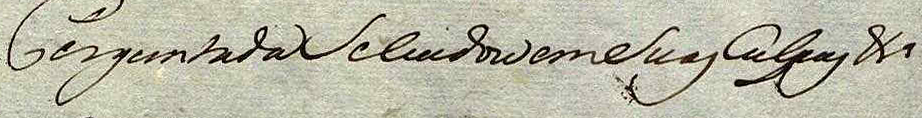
Perguntada Se cuidou em Suas Culpas &a
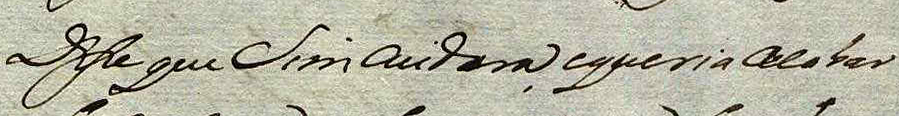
Disse que Sim cuidara, e queria acabar
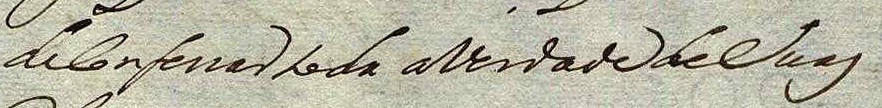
de Confessar toda a verdade de Suas
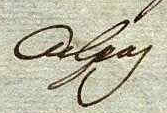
Culpas
